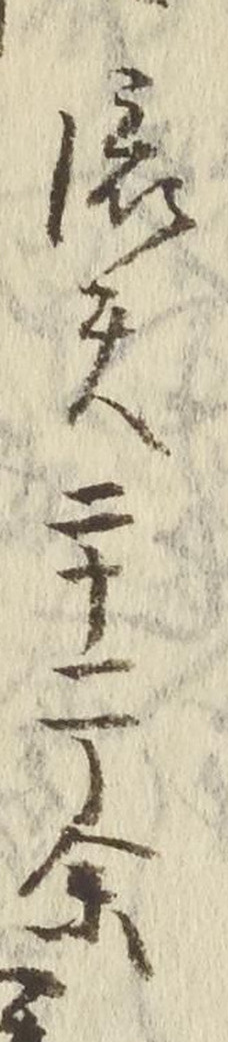中条二十一丁余
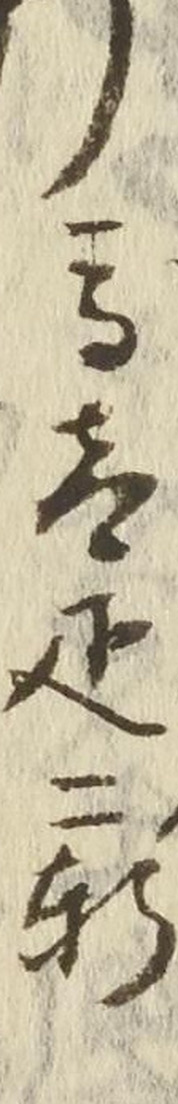馬壱疋二軒
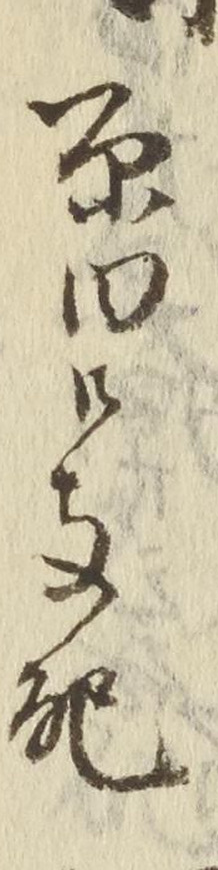原田御支配
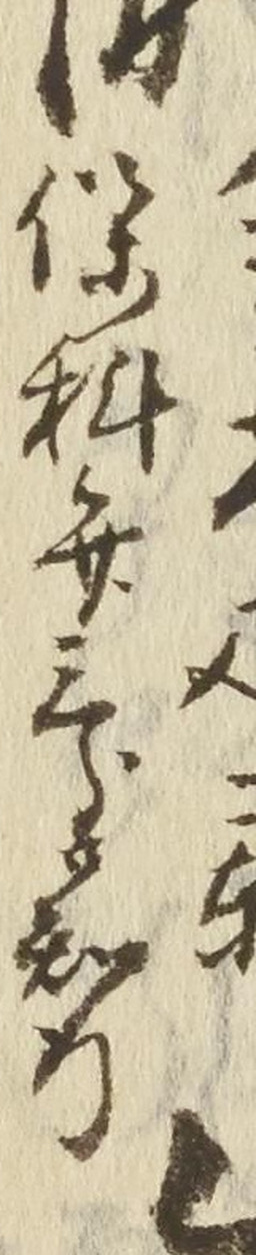保科弁三郎御知行
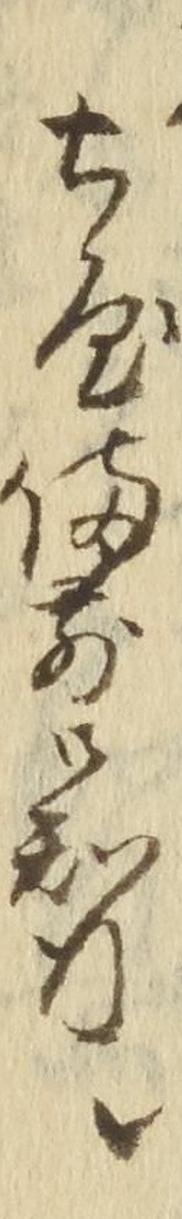土屋備前御知行所
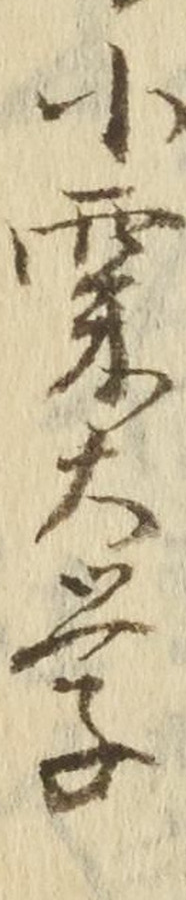小栗大学
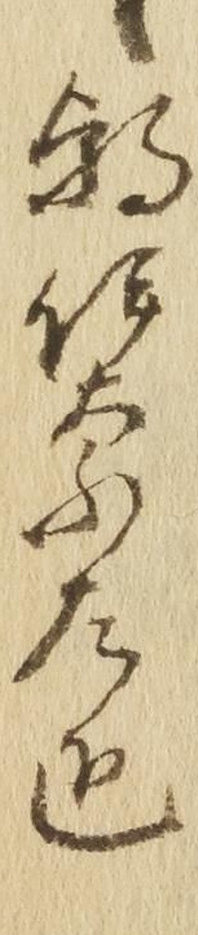朝伊奈左近
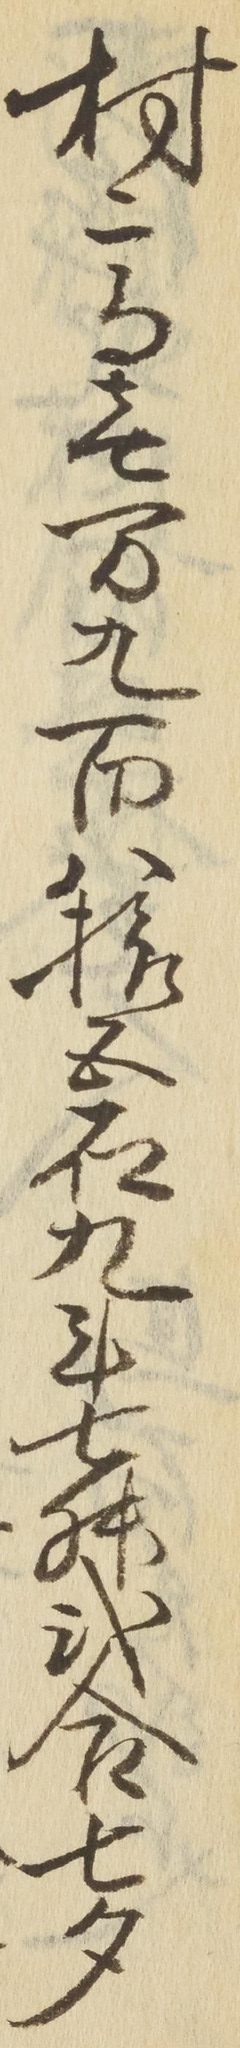村高壱万九百八拾五石九斗七升弐合七夕
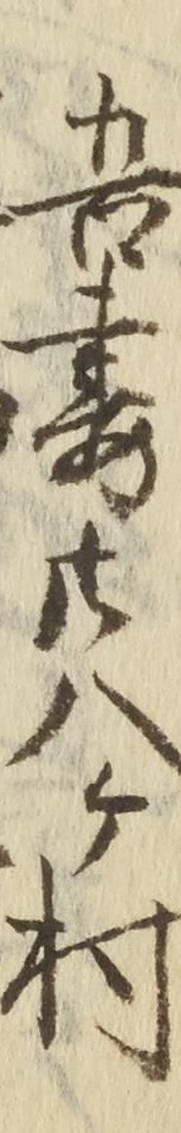吾妻廿八ヶ村
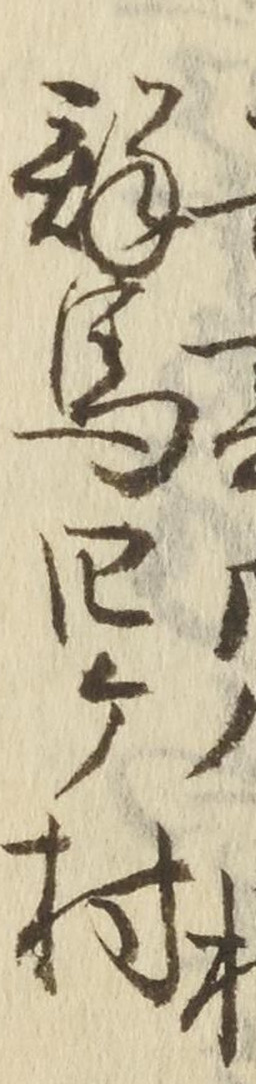群馬四ヶ村
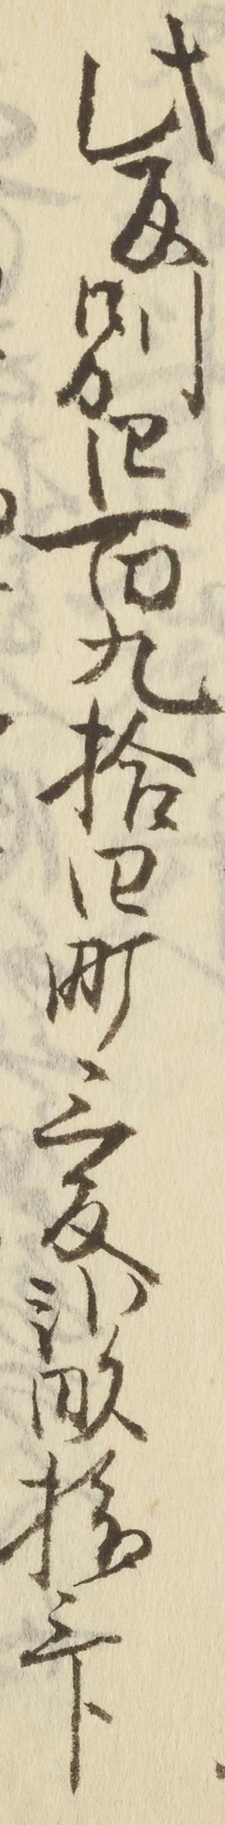此反別四百九拾四町三反弐畝拾三部
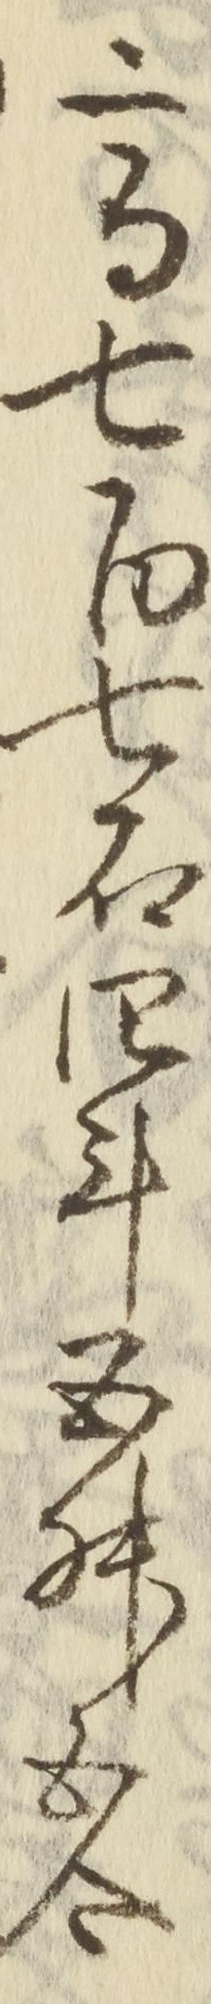高七百七石四斗五升五合
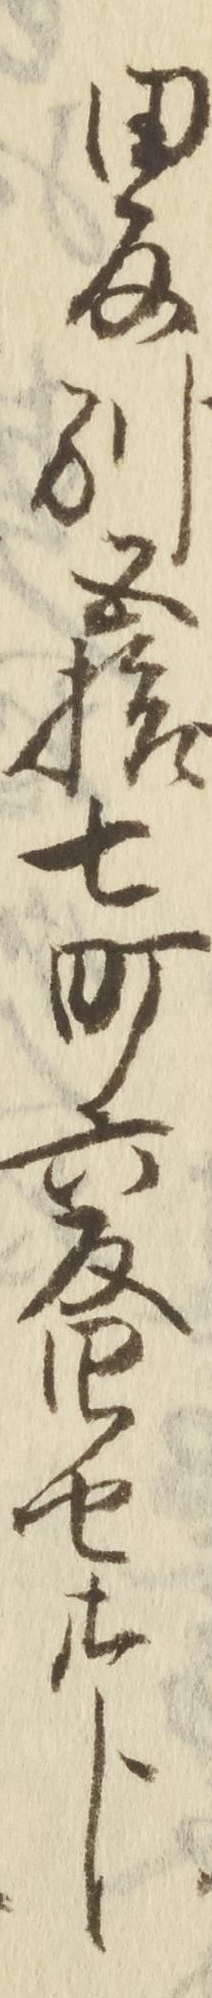田反別五拾七町六反四せ廿部
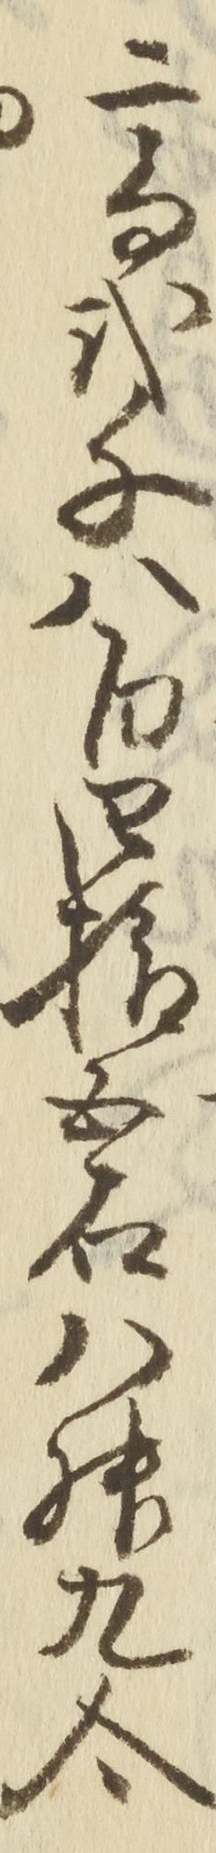高弐壱千八百四拾五石八升九合
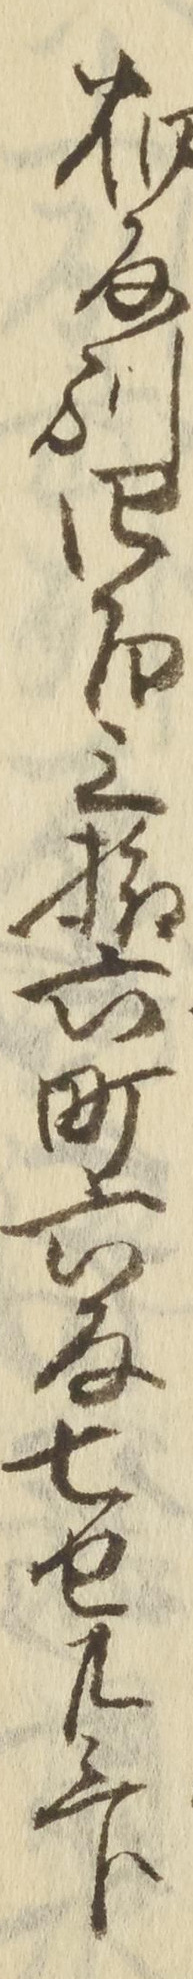畑反別四百三拾六町六反七せ廿三部
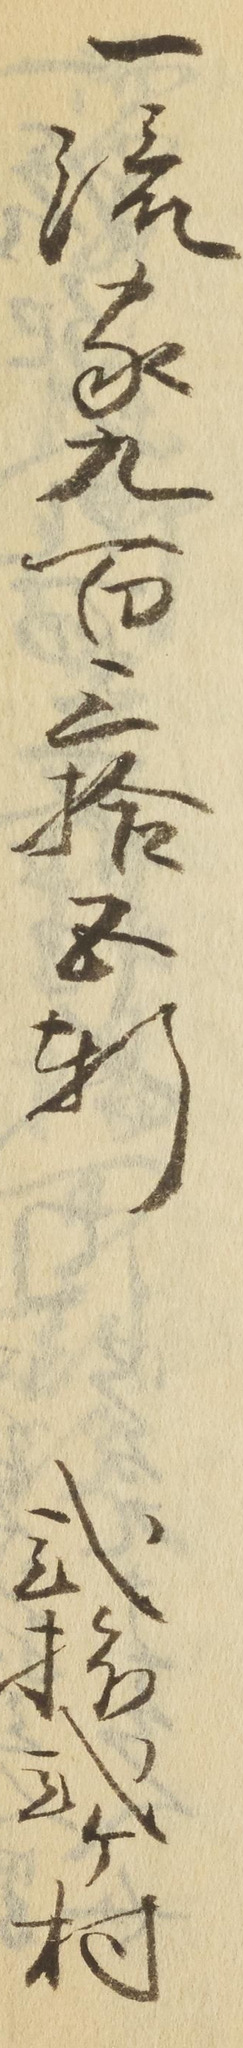一流家九百三拾五軒弐拾弐ヶ村
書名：浅間大變記
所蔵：東京大学地震研究所図書室 Earthquake Research Institute Library, The University of Tokyo, JAPAN
